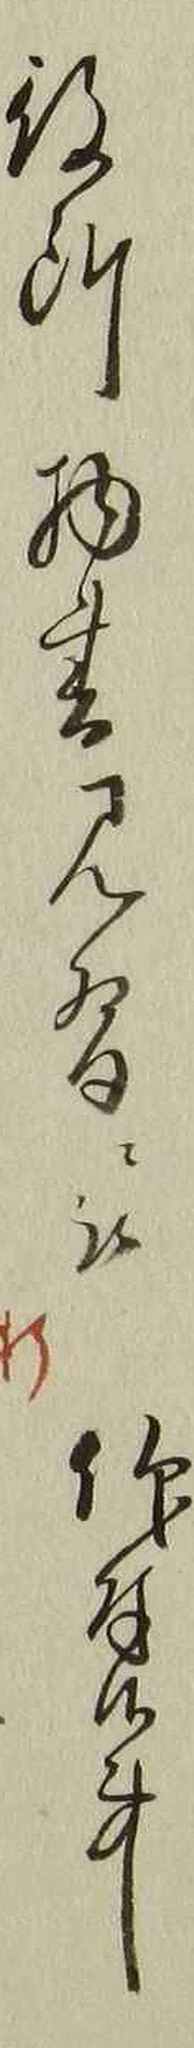役所物書見習ニ被仰付候事
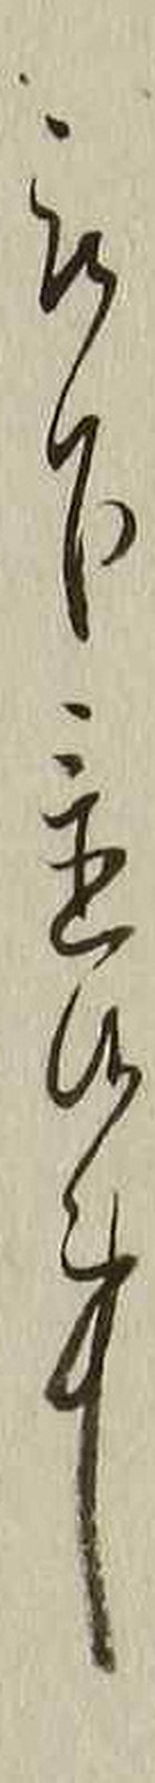被下置候事
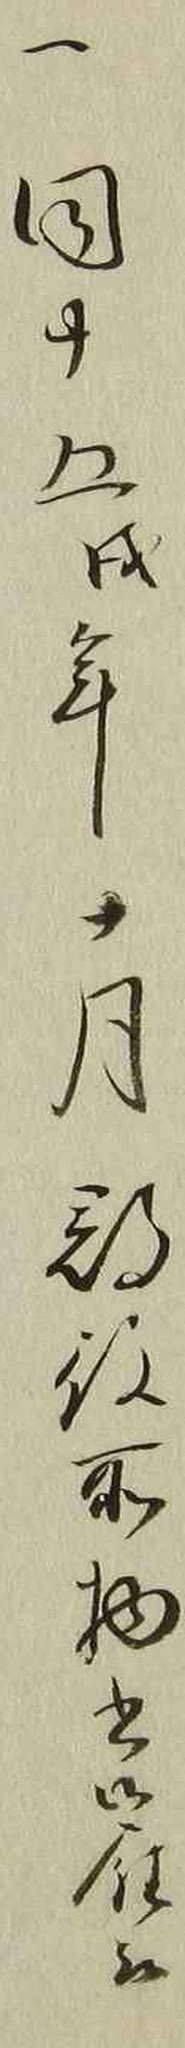同十五戌年十月郡役所物書御雇被
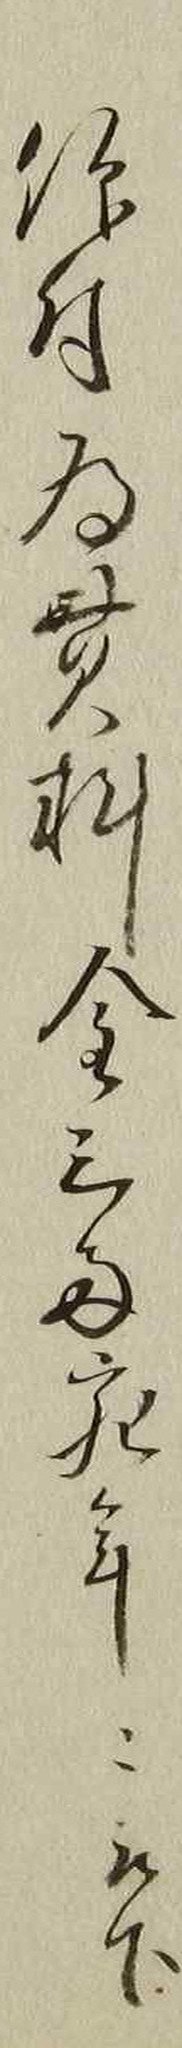仰付為費料金三両宛年々被下
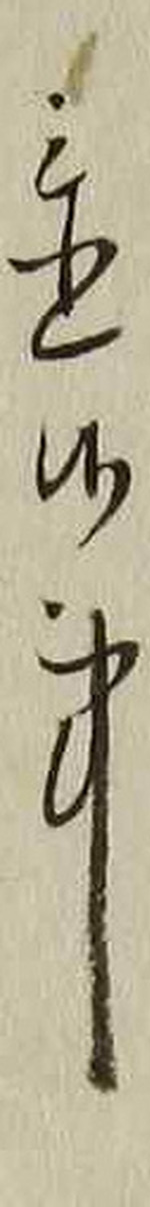置候事
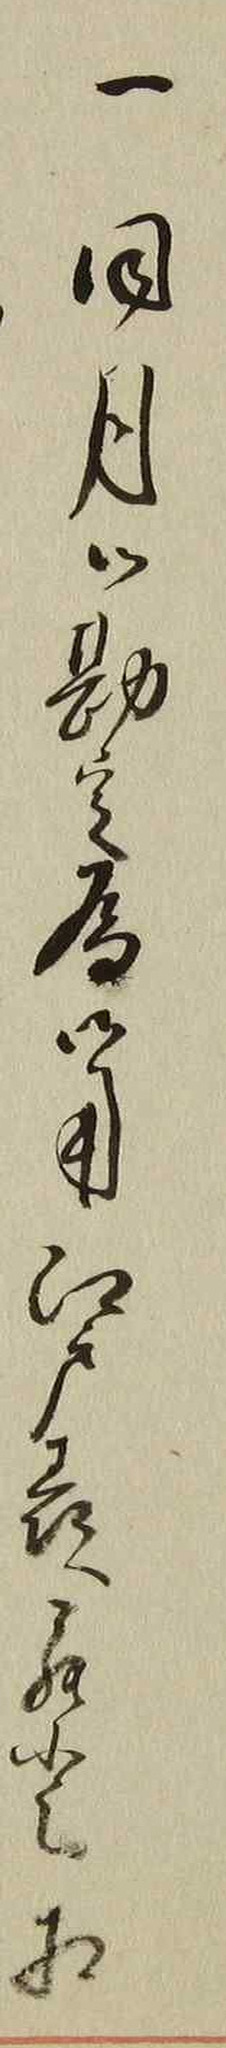一同月御勘定為御用江戸表へ罷登相
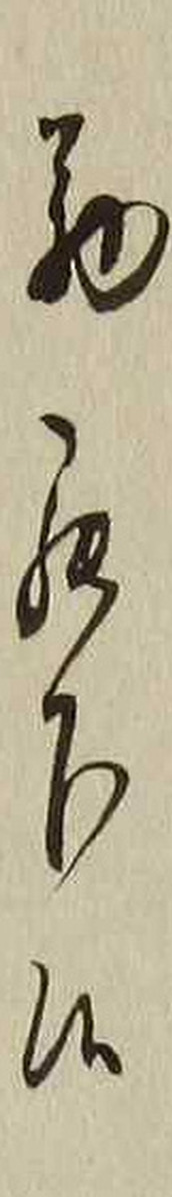勤罷下候
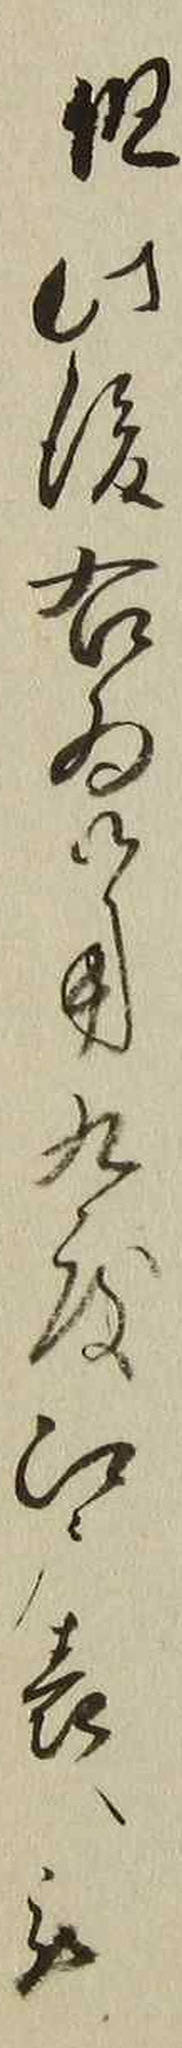但此後右為御用九度江戸表へ被
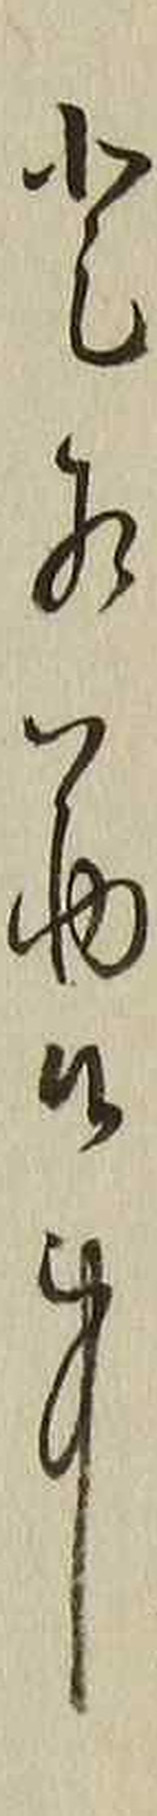登相勤候事
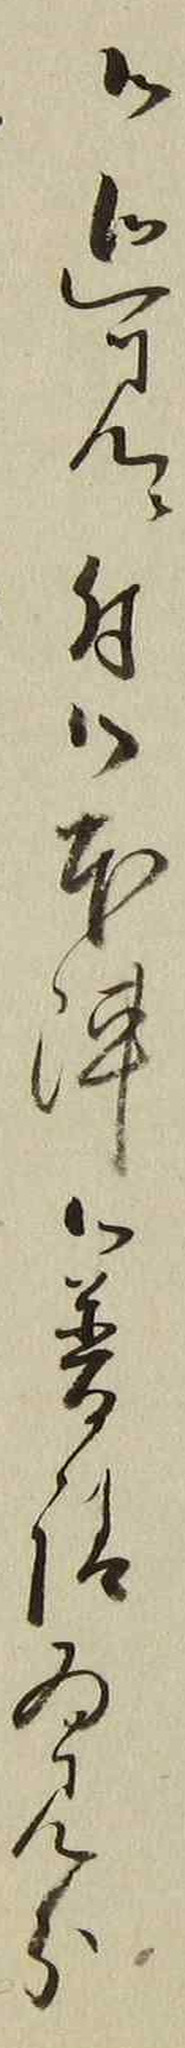御巡見ニ付御本陣御普請為見分
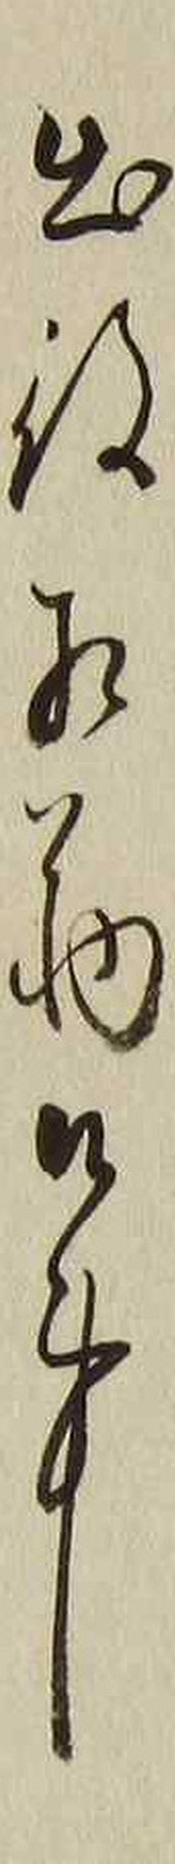出役相勤候事
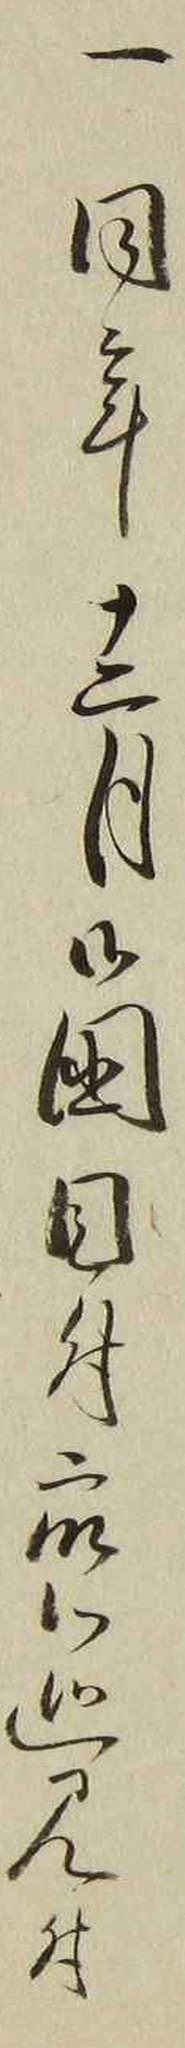一同年十二月御国目付衆御巡見付
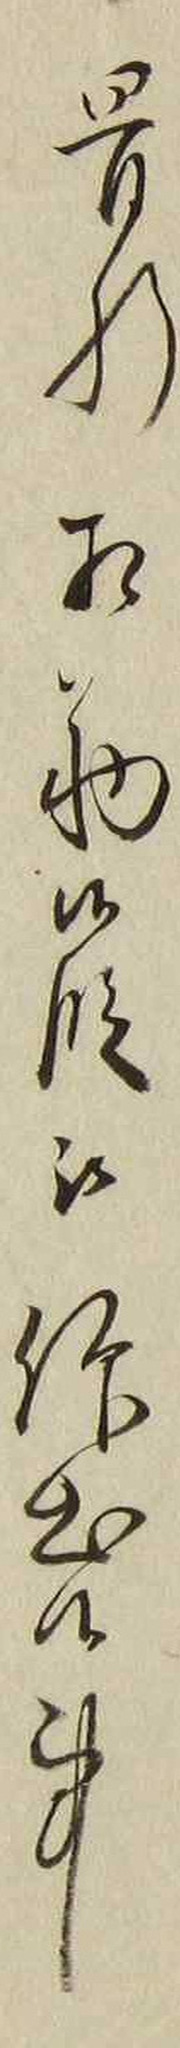骨折相勤候段被仰出候事
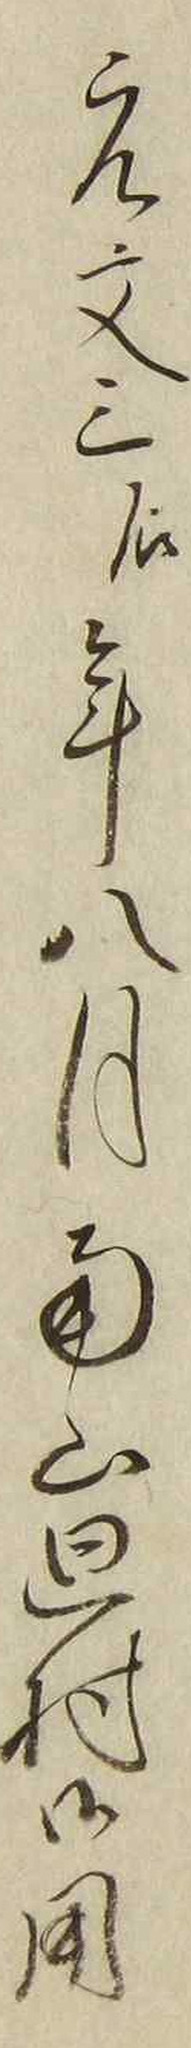元文三辰年八月南山廻村御用

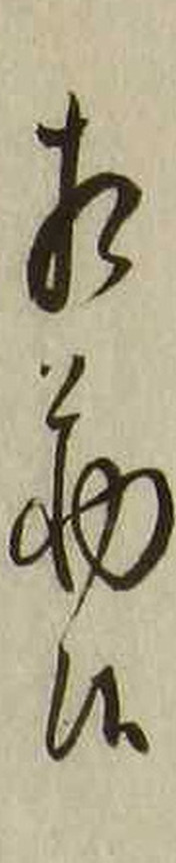相勤候
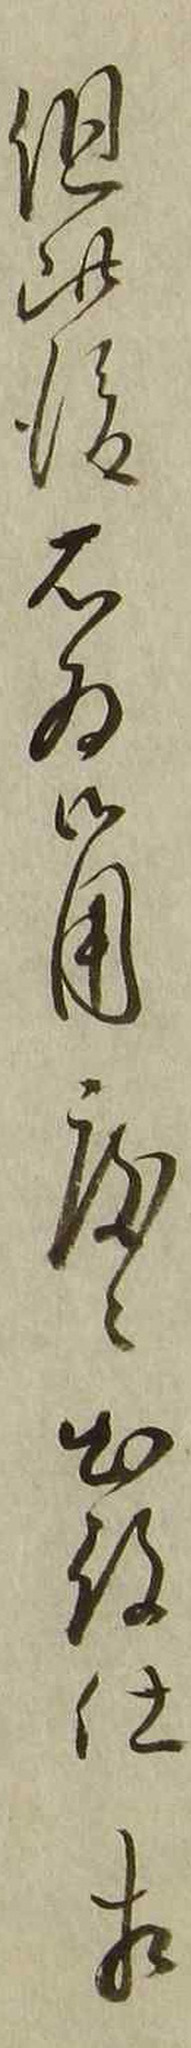但此後右為御用度々出役仕相
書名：諸士系譜　巻之132　た之部8
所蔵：会津若松市立会津図書館
